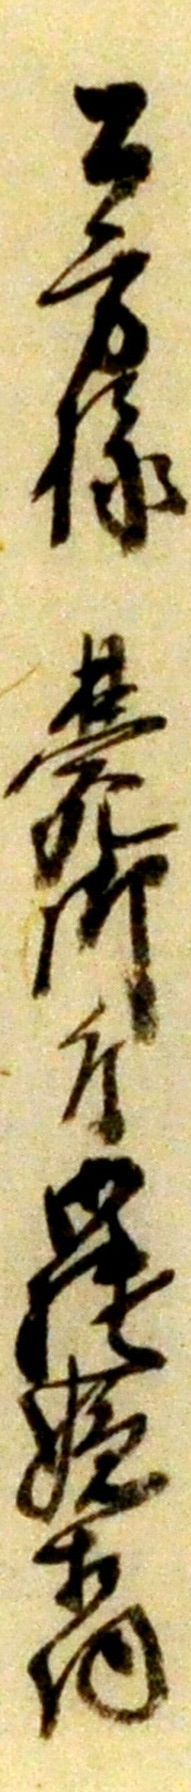公方様薨御付御機嫌相伺
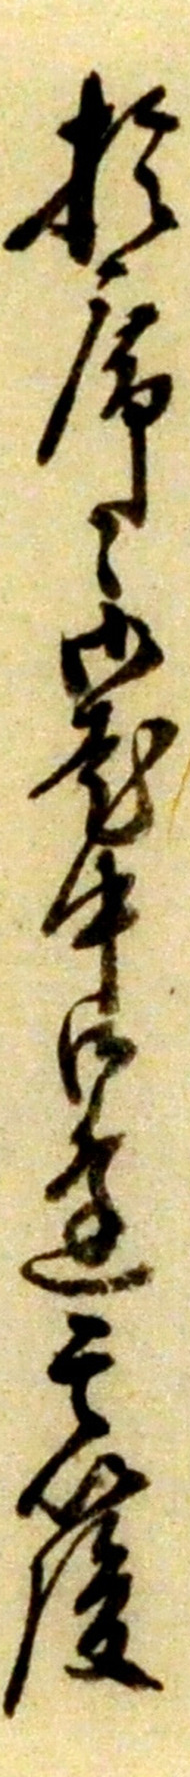於席々御老中御達其以後
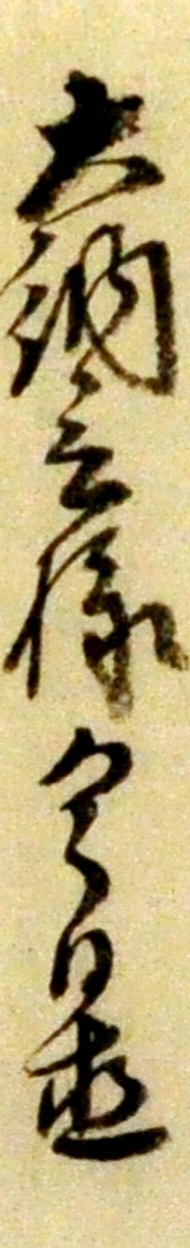大納言様今日直
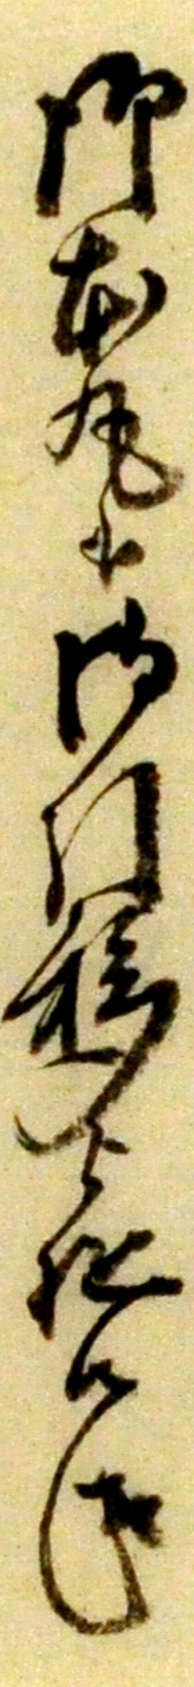御本丸江御引移被遊候趣
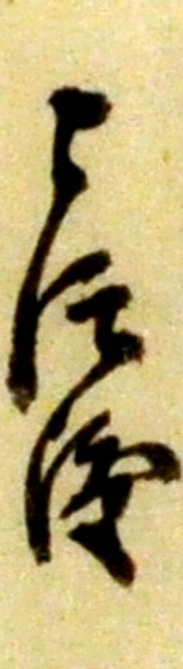被仰渡
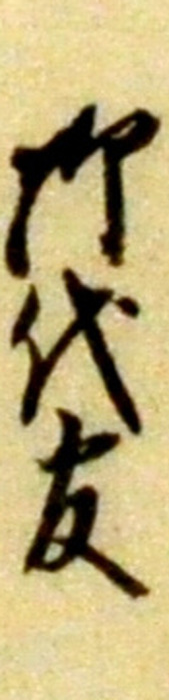御代官
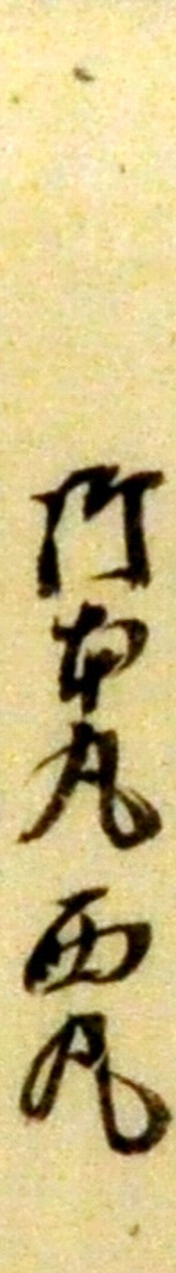御本丸西丸
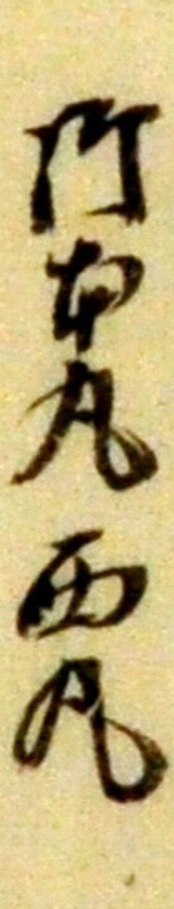御本丸西丸
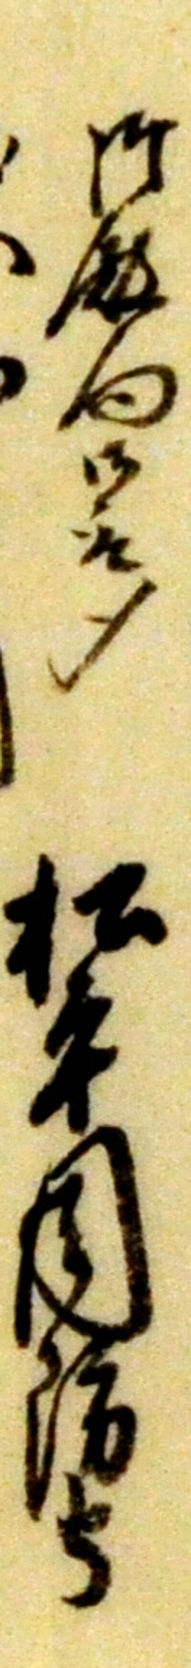御殿向御取〆松平周防守
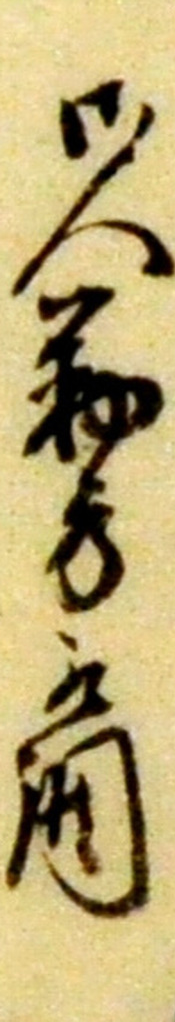御人勤方取調

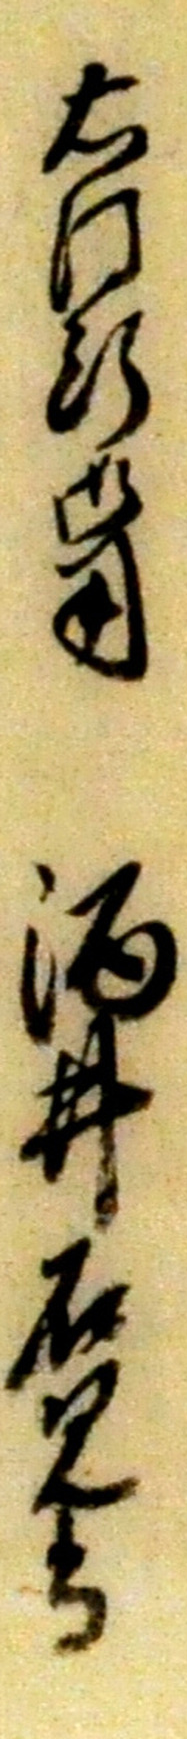右同断御用酒井石見守
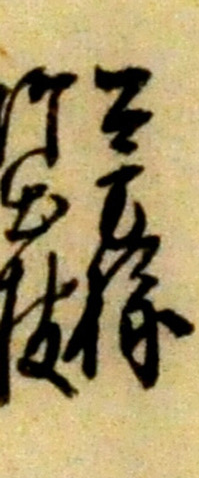御出棺
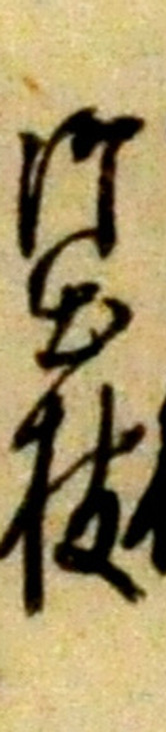御出棺
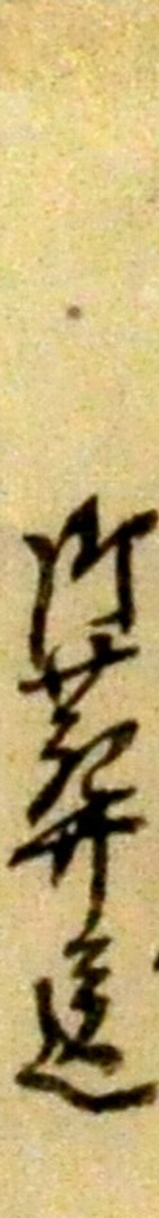御葬送
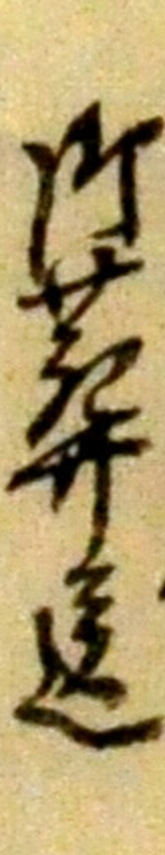御葬送
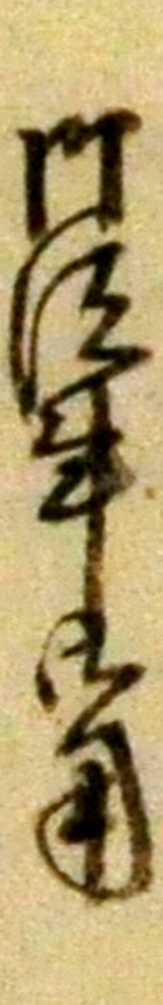御法事御用
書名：書抜
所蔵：伊那市立高遠町図書館・合同会社AMANE
